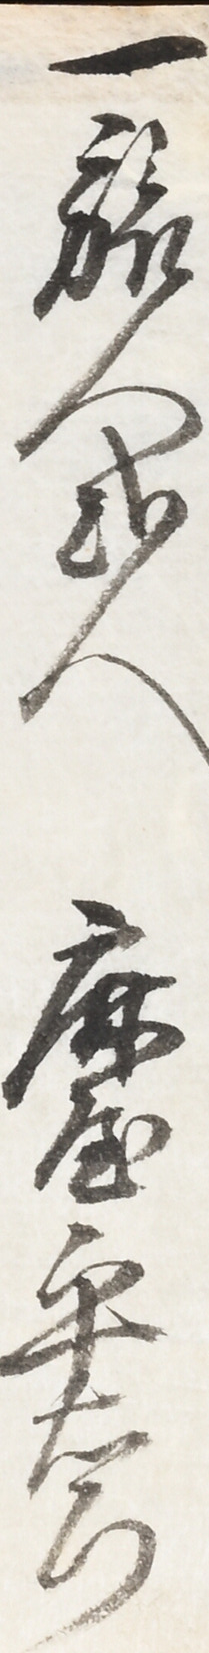一旅人弐人麻屋平右衛門
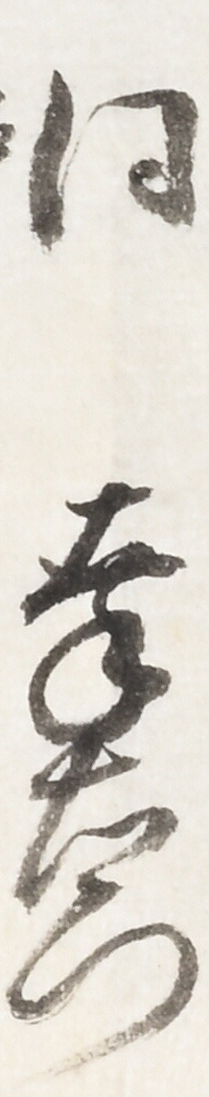同幸右衛門
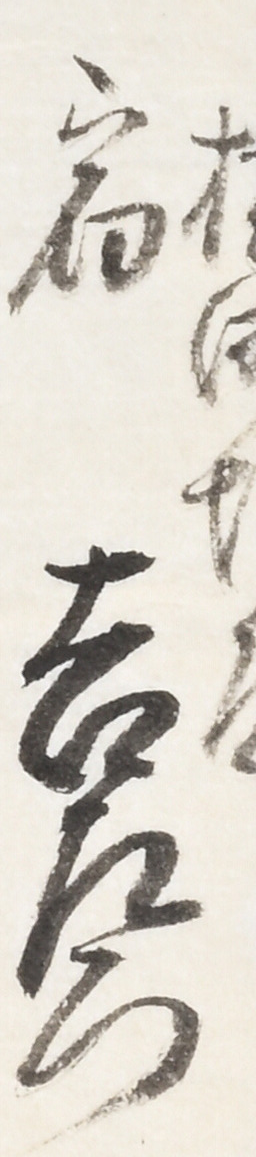宿吉左衛門
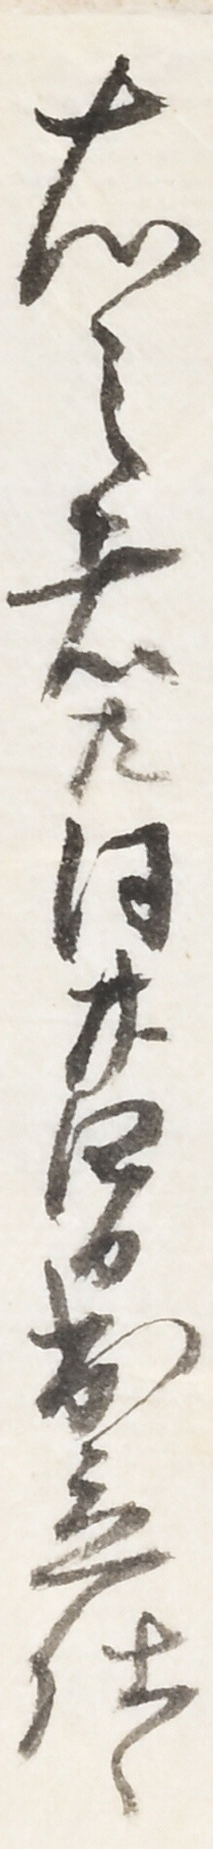右之者共同廿四日出立仕候
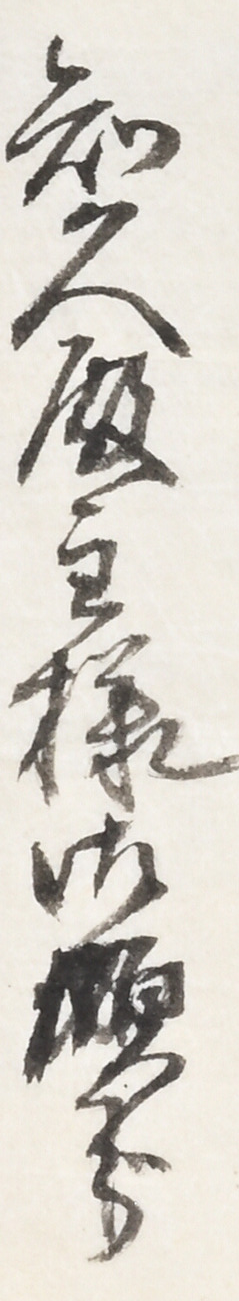知久領主様御領分
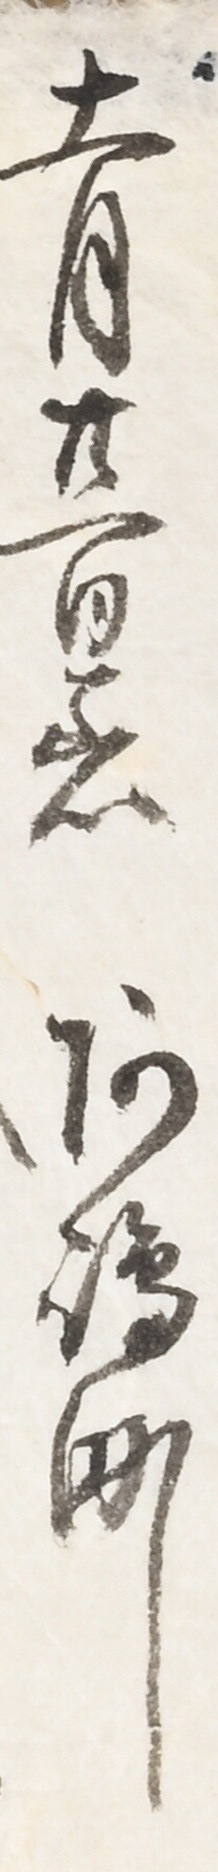十一月廿一日着阿嶋町
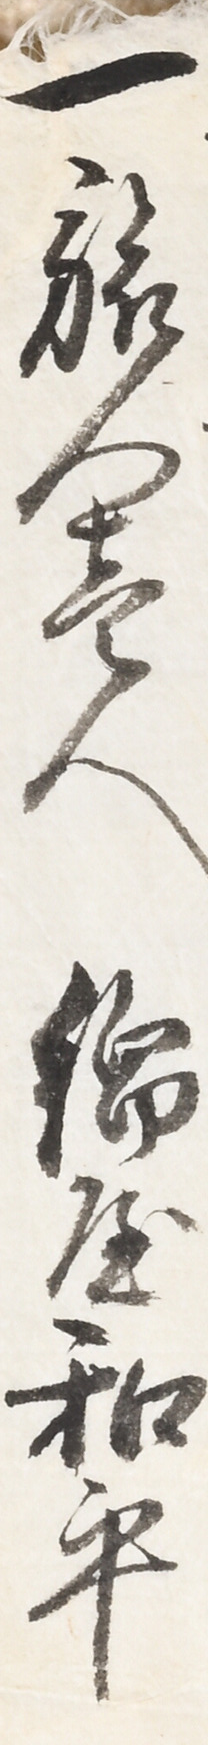一旅人壱人綿屋和平
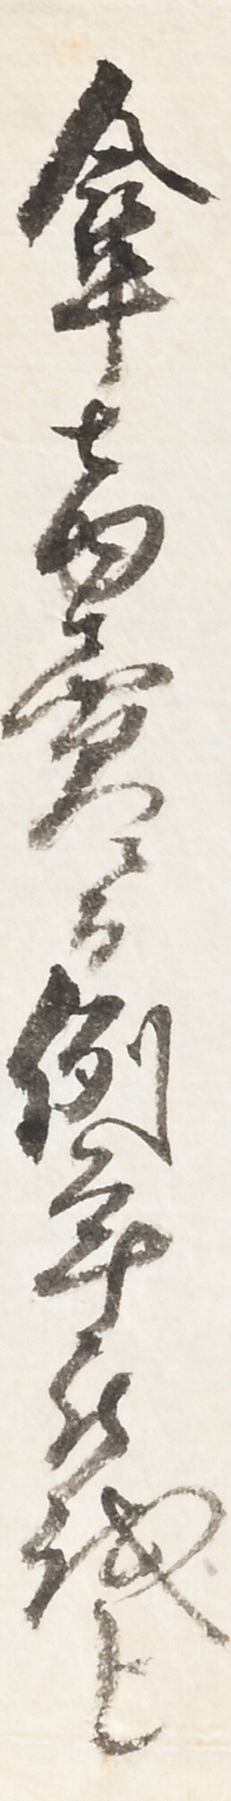傘商売ニ而例年罷越申候
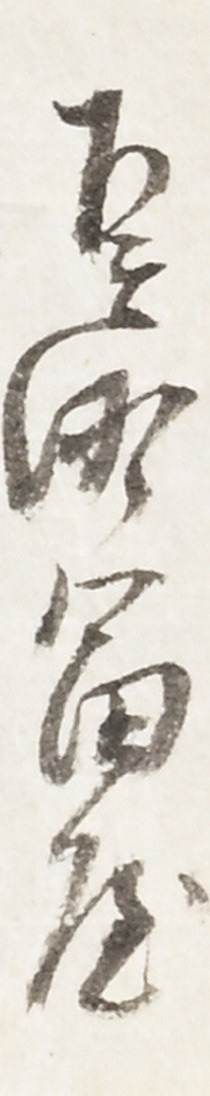下モ町冨屋
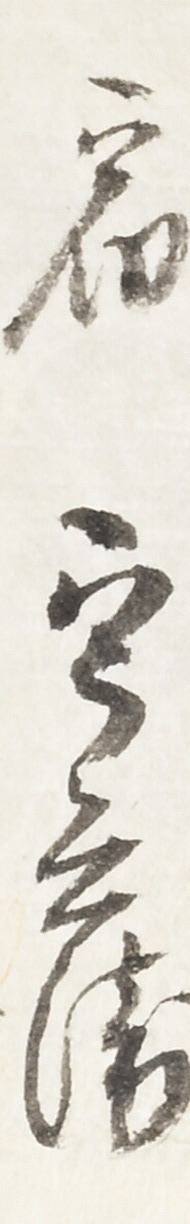宿宇兵衛
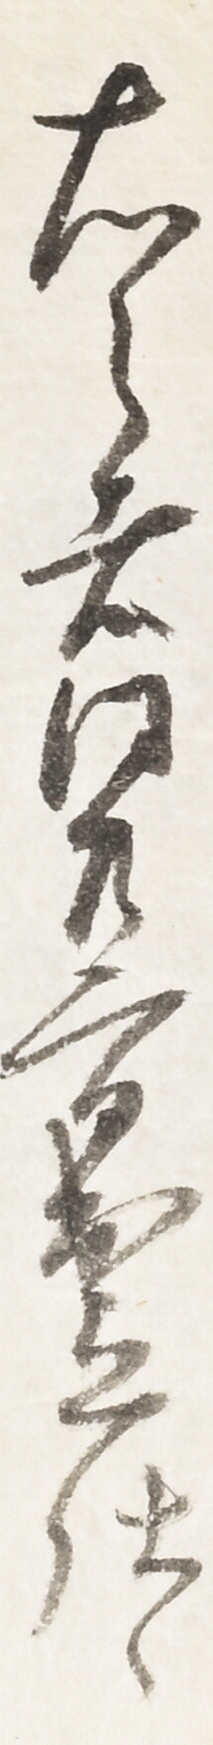右之者同廿二日出立仕候
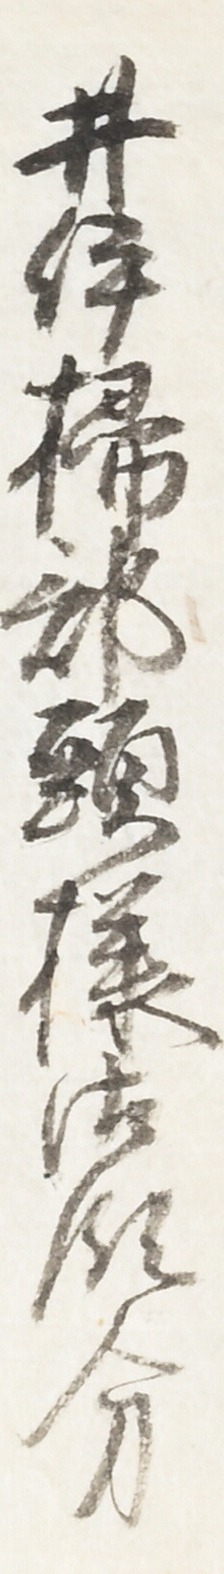井伊掃部頭様御領分
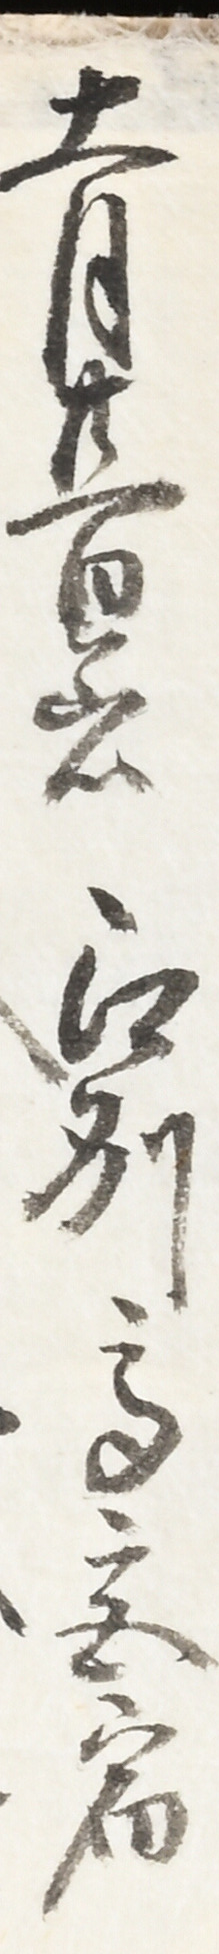十一月廿一日着江州高宮宿
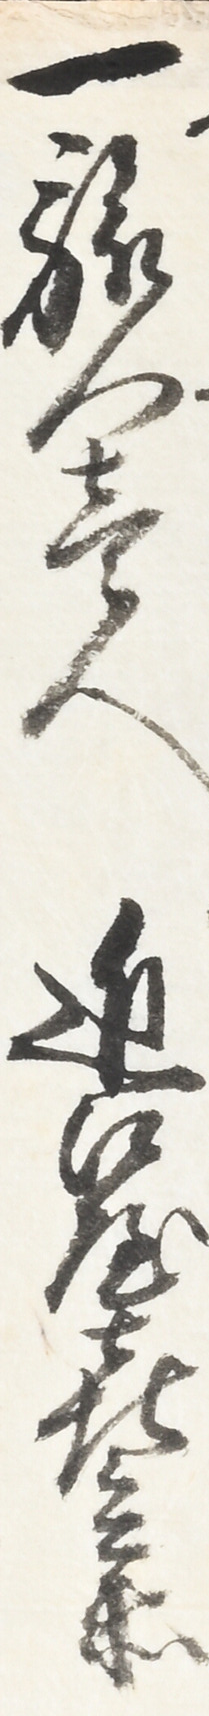一旅人壱人近江屋喜兵衛
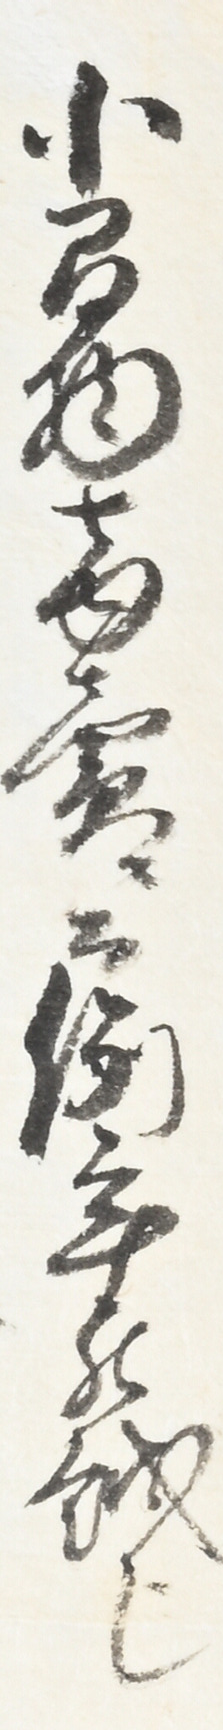小間物商売ニ而例年罷越申候
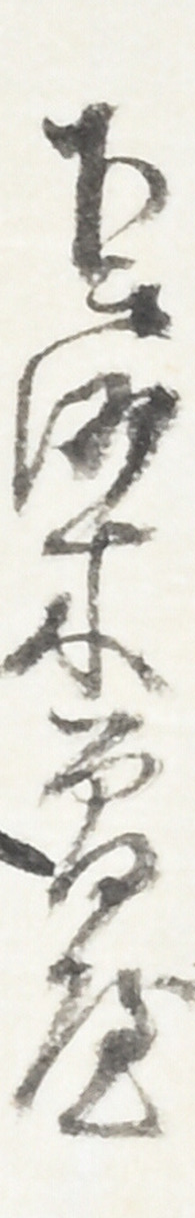下モ町木曽屋
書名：旅人泊控帳
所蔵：伊那市立高遠町図書館・合同会社AMANE
